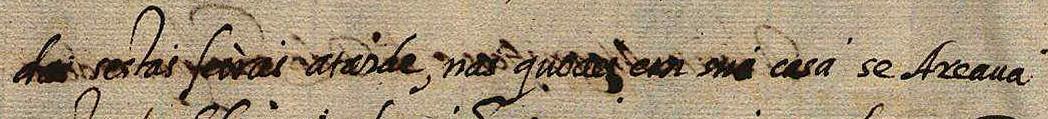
das sestas feiras a tarde, nas quoaes em sua casa se Areaua
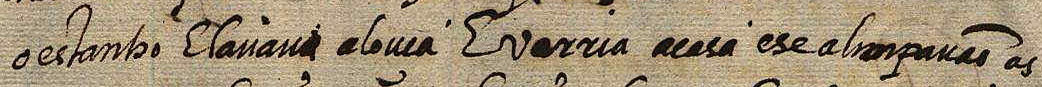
o estanho E lauaua a louça E varria a casa e se alimpauão as
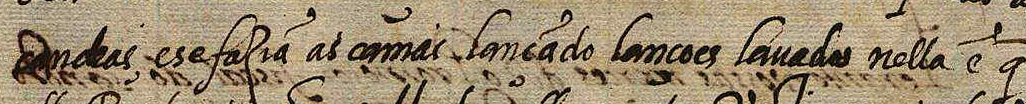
candeas, e se faziā as camas lançādo lançoes lauados nella ē q̄
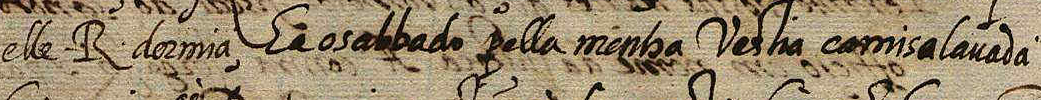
elle R. dormia, E ao sabbado pella menha Vestia camisa lauada
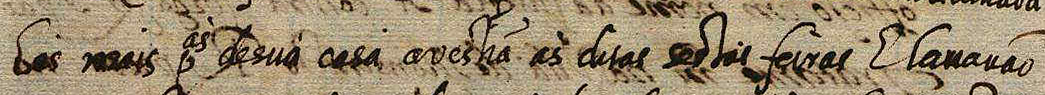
E as mais pas de sua casa a vestiā as ditas sestas feiras E lauauaõ
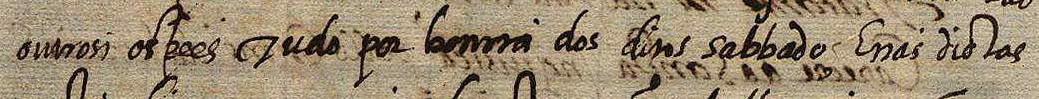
outrosi os pees tudo por honrra dos ditos sabbados E nas dictas
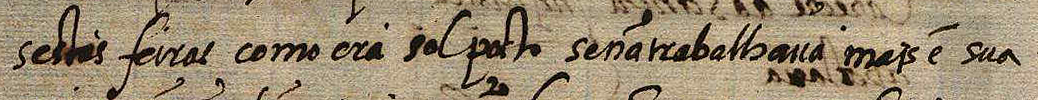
sestas feiras como era sol posto se nā trabalhaua majs ē sua
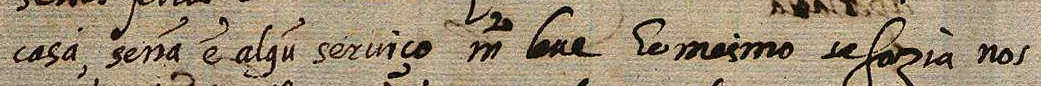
casa, senā ē algū seruiço mto leue E o mesmo se fazia nos
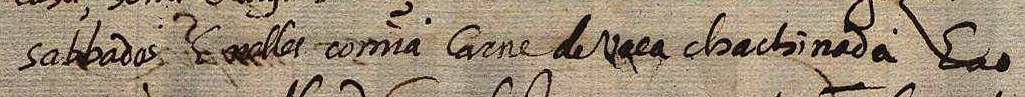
sabbados E nelles comia Carne de vaca chachinada E ao
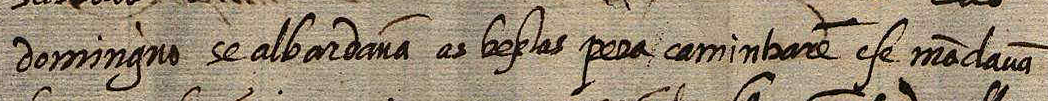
dominguo se albardauā as bestas pera caminharē e se mādauā
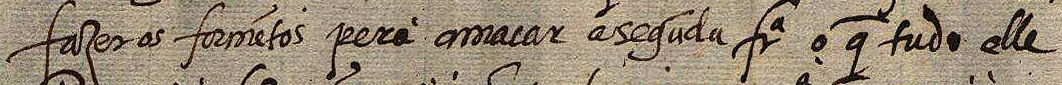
fazer os formētos pera amaçar a segūda fra o q̄ tudo elle
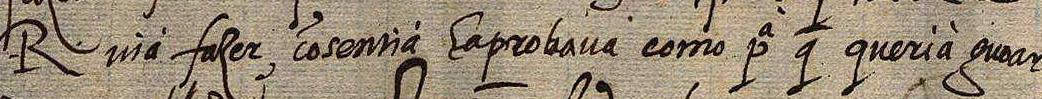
R uia fazer, cōsentia E aprobaua como pa q̄ queria guoar
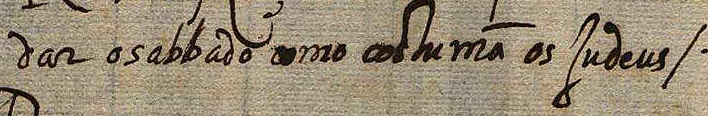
dar o sabbado como costumā os Judeus /.
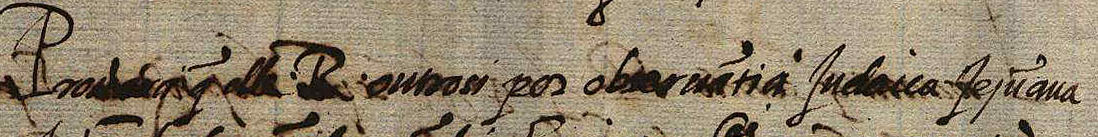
Prouara q̄ elle R. outrosi por obseruātia Judaica Jejūaua
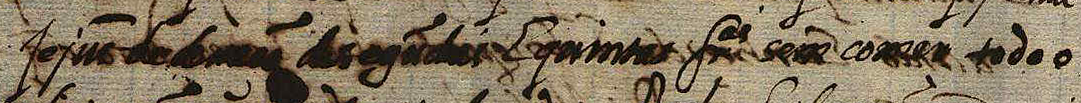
Jejūs de _çaõ das segūdas E quintas fr.as sem comer todo o
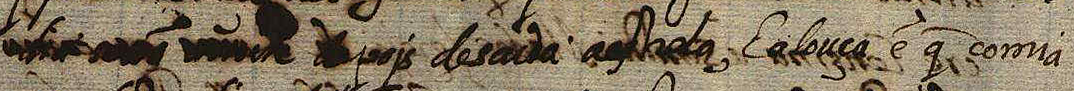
dia _ noite depojs de saida a estrela, E a louça ē q̄ comia
